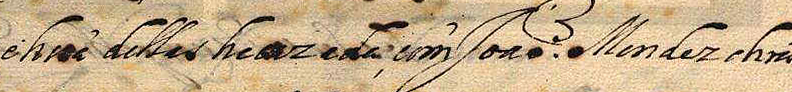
e huā dellas he cazada, com̄ Joaõ Mendez chris
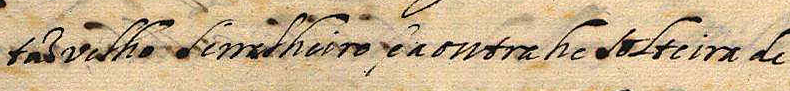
taõ velho Serralheiro, e a outra he solteira de
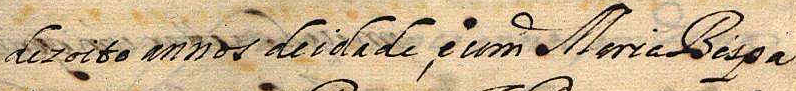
dezoito annos de idade, e com̄ Maria Bispa
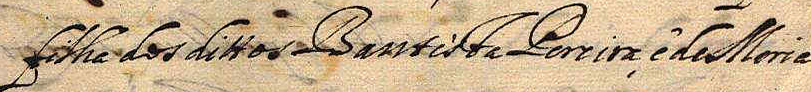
filha dos dittos Bautista Pereira, e de Maria
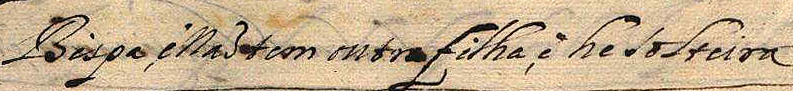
Bispa, e Naõ tem outr_ filha, e he solteira
